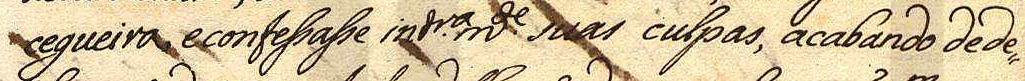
cegueira e confessasse intr.amt.e suas culpas, acabando de de
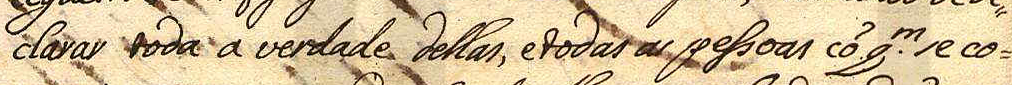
clarar toda a verdade dellas, e todas as pessoas cō q.m se co
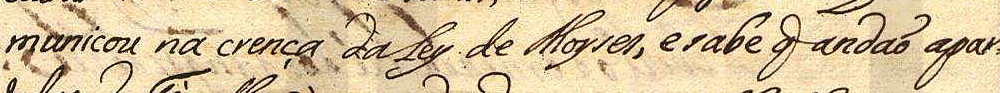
municou na crença da Ley de Moyses, e sabe q̄ andaõ apar
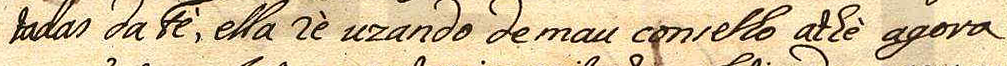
tadas da Fé, ella rè uzando de mau conselho athé agora
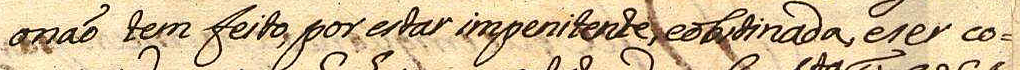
o naõ tem feito, por estar impenitente, e obstinada, e ser co
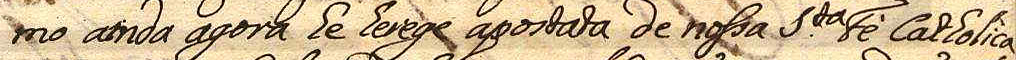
mo ainda agora he herege apostata de nossa S.ta Fè Catholica
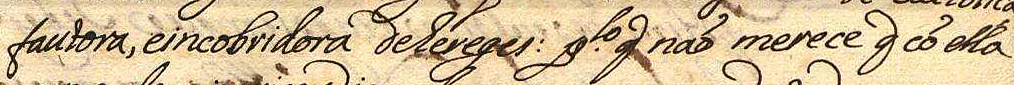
fautora, e incobridora de hereges: p.lo q̄ naõ merece q̄ cō ella
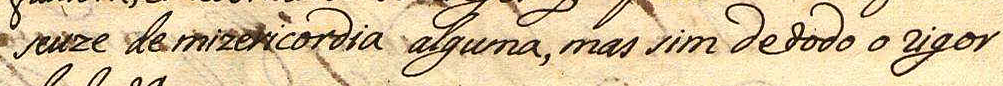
se uze de mizericordia alguma, mas sim de todo o rigor
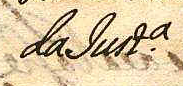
da Iust.a
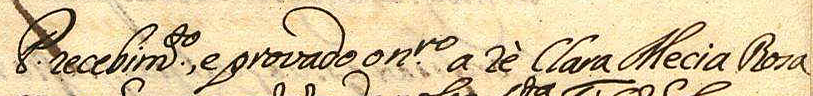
P. recebim.to, e provado o n.ro a Rè Clara Mecia Rosa
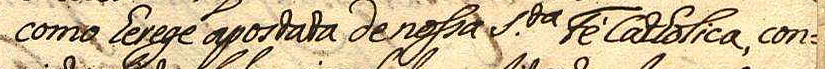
como herege apostata de nossa S.ta Fè Catholica, con
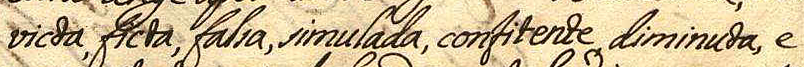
victa, ficta, falsa, simulada, confitente, diminuta, e
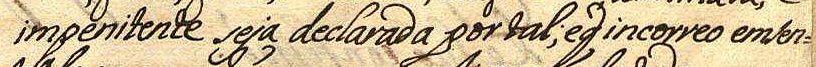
impenitente seja declarada por tal; e q̄ incorreo em sen
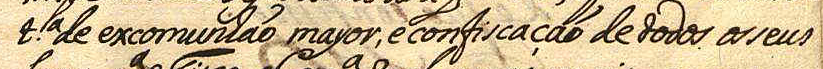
t.a de excomunhaõ mayor, e confiscaçaõ de todos os seus
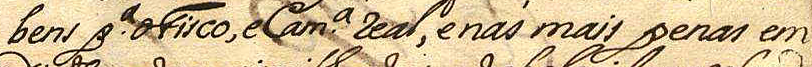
bens p.a o Fisco, e Cam.a Real, e nas mais penas em
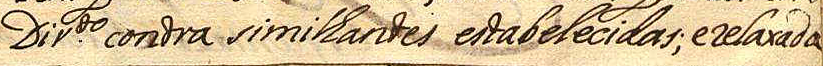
Dir.to contra similhantes estabelecidas; e relaxada
